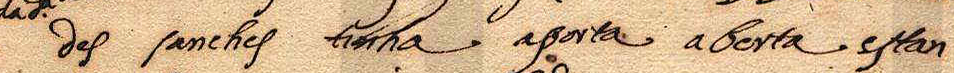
des sanches tinha a porta aberta Estan
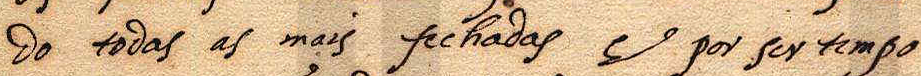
do todas as mais fechadas E por ser tempo
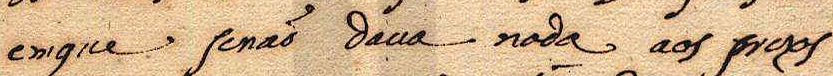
em que se não daua nada aos prezos E
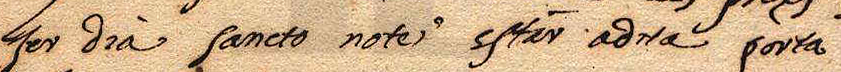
ser dia sancto notei Estar a dita porta
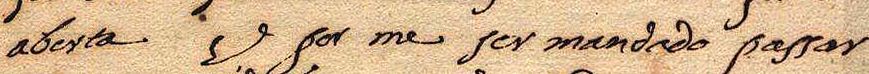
aberta E por me ser mandado passar
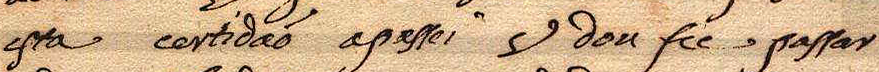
esta certidão a passei E dou fee passar
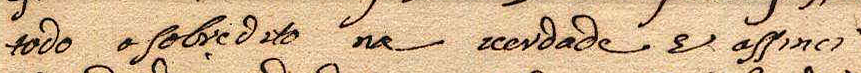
todo o sobredito na uerdade E assinei
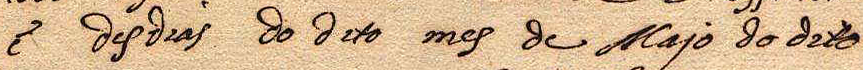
ē des dias do dito mes de Majo do ditto
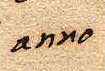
anno
